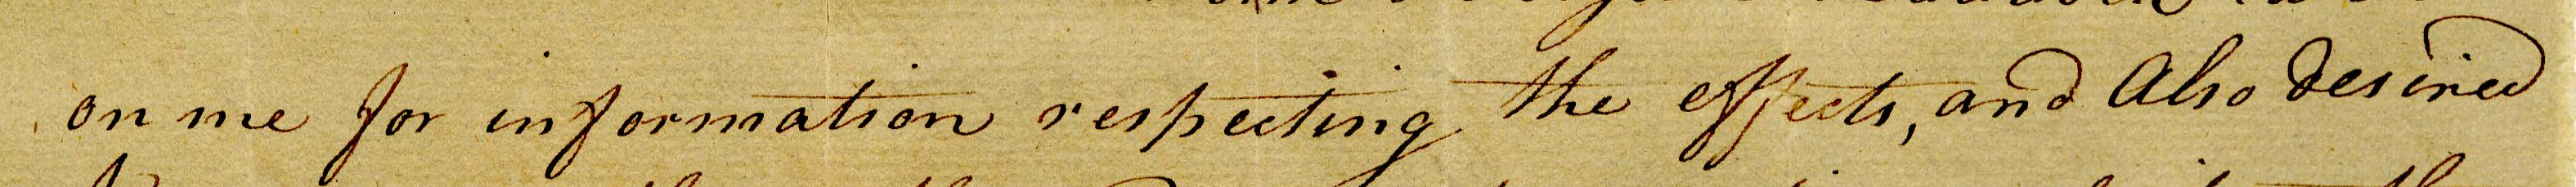on me for information respecting the effects, and Also desired
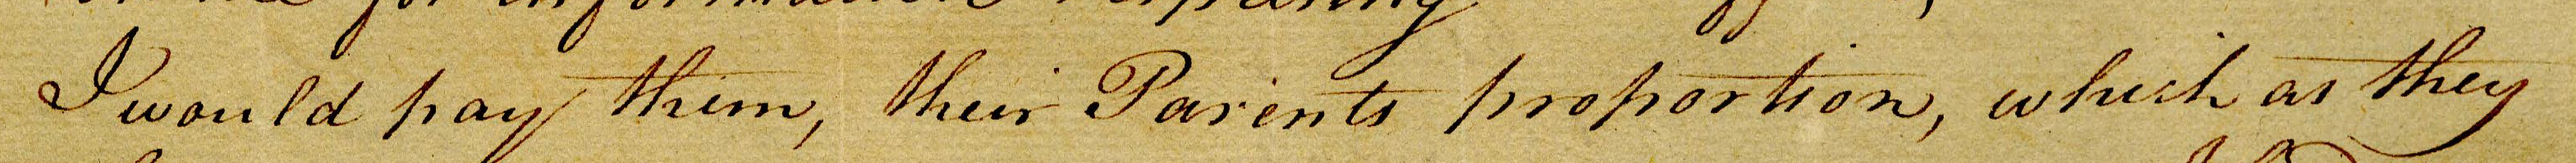I would pay them, their Parents proportion, which as they
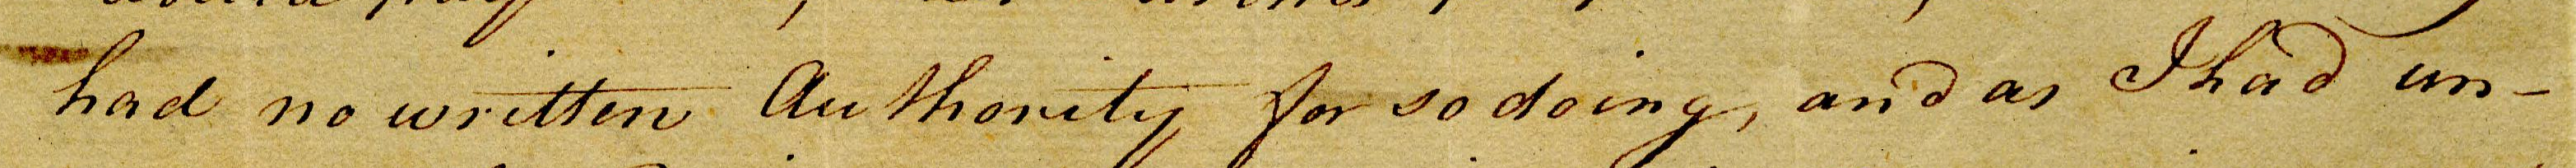had no written authority for so doing, and as I had un-
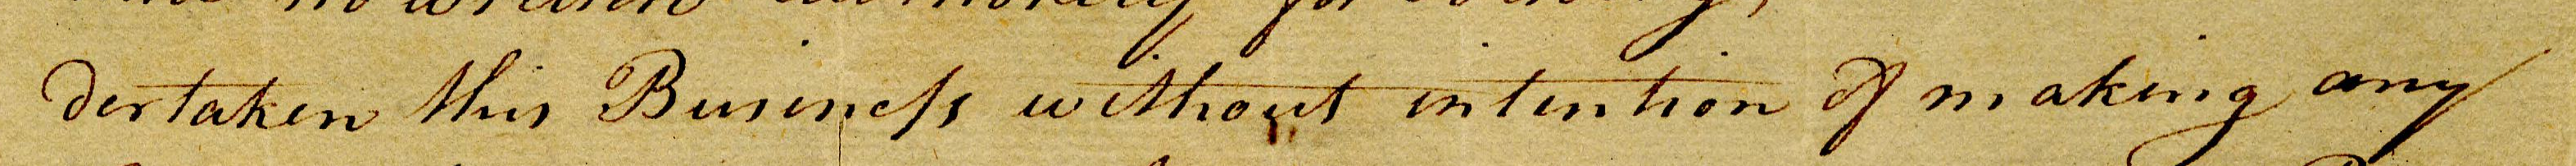dertaken this Business without intention of making any
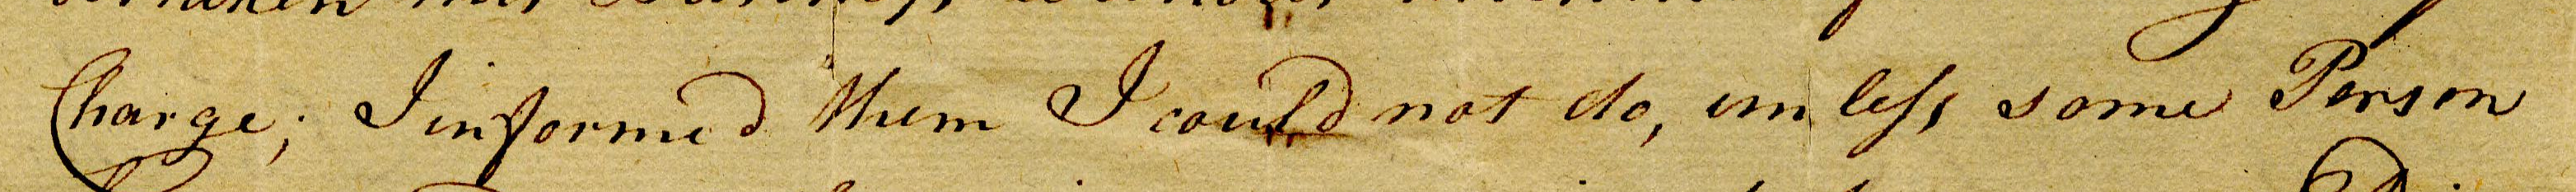Charge; I infomred them I could not do, unless some Person
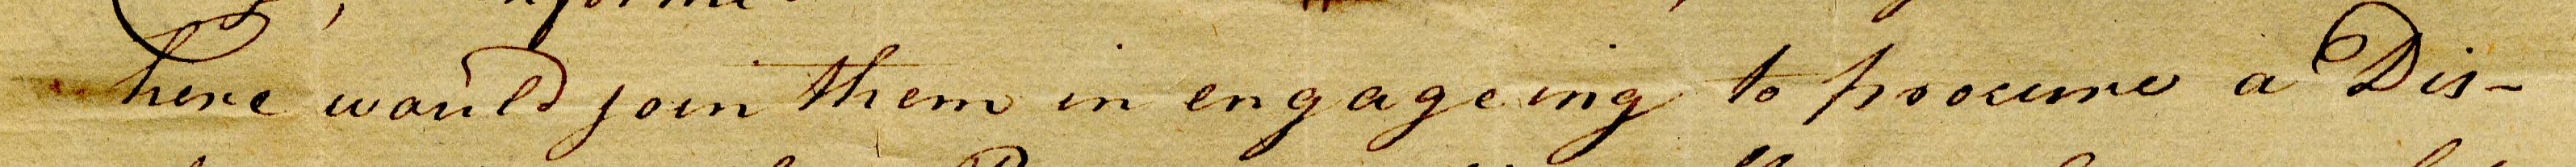here would join them in engaging to procure a Dis-
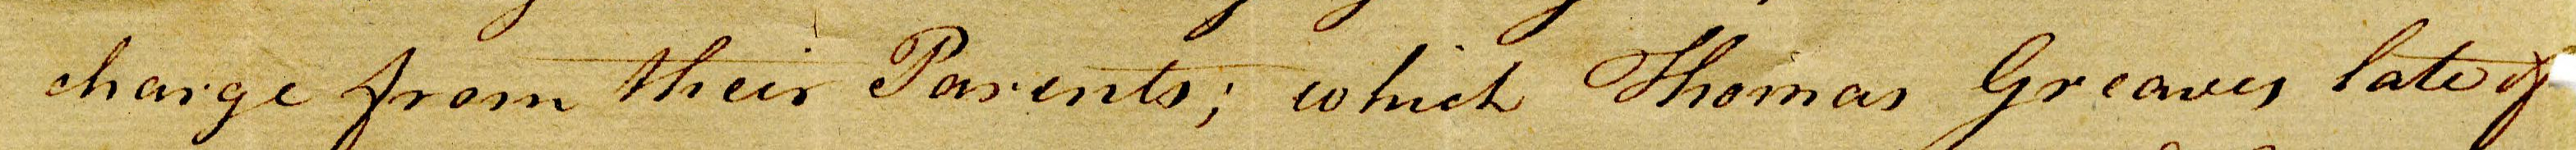charge from their Parents; which Thomas Greaves late of
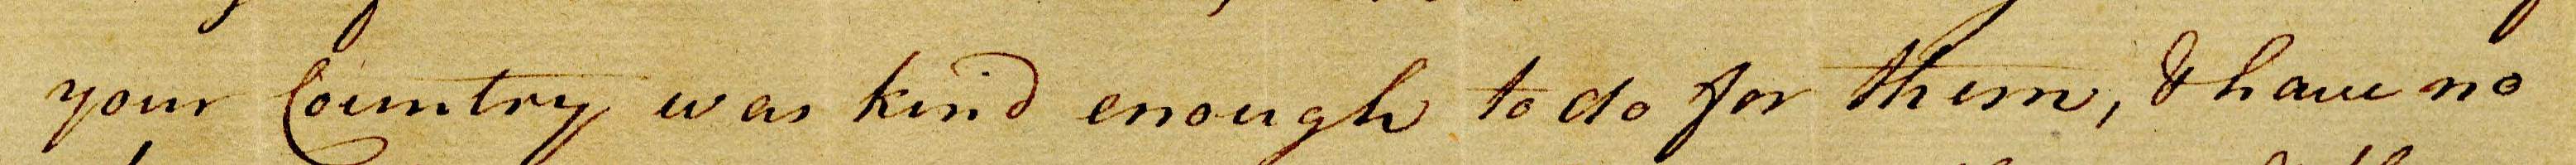your Country was kind enough to do for them, I have no
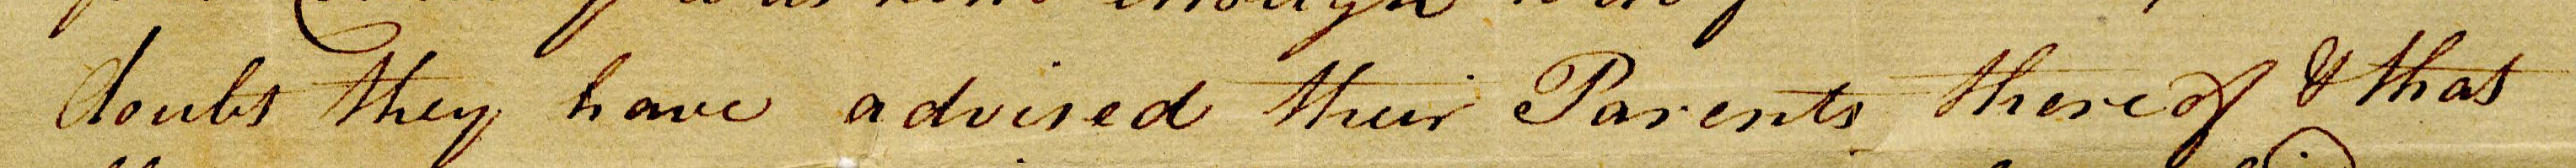doubts they have advised their Parents thereof & that
